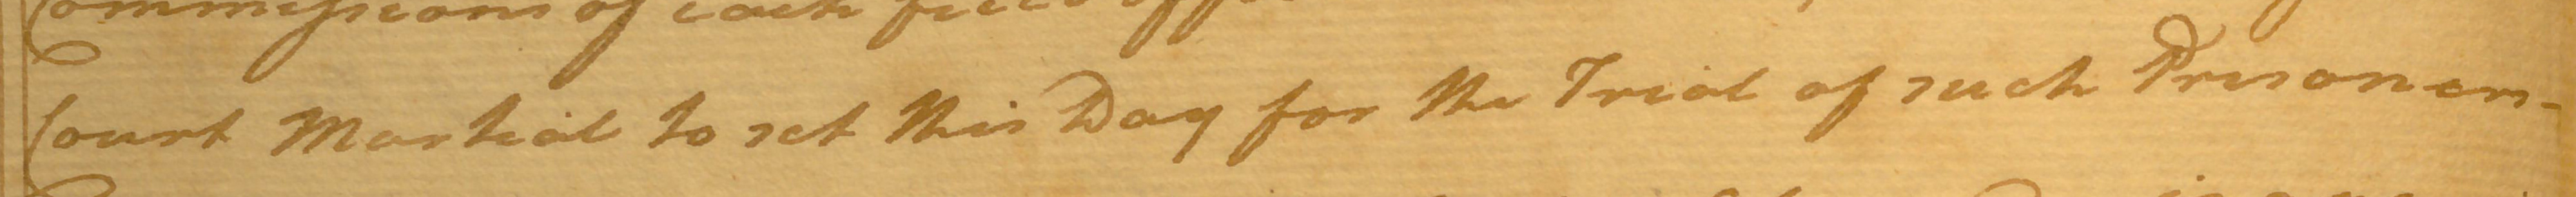Court Martial to set this Day for the Trial of such Prisoners
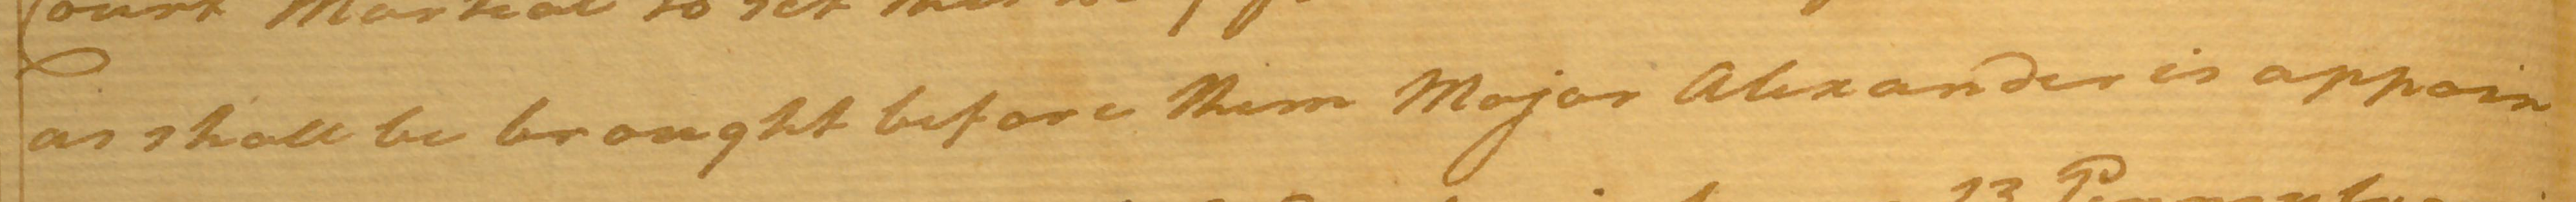as shall be brought before them Major Alexander is appoin
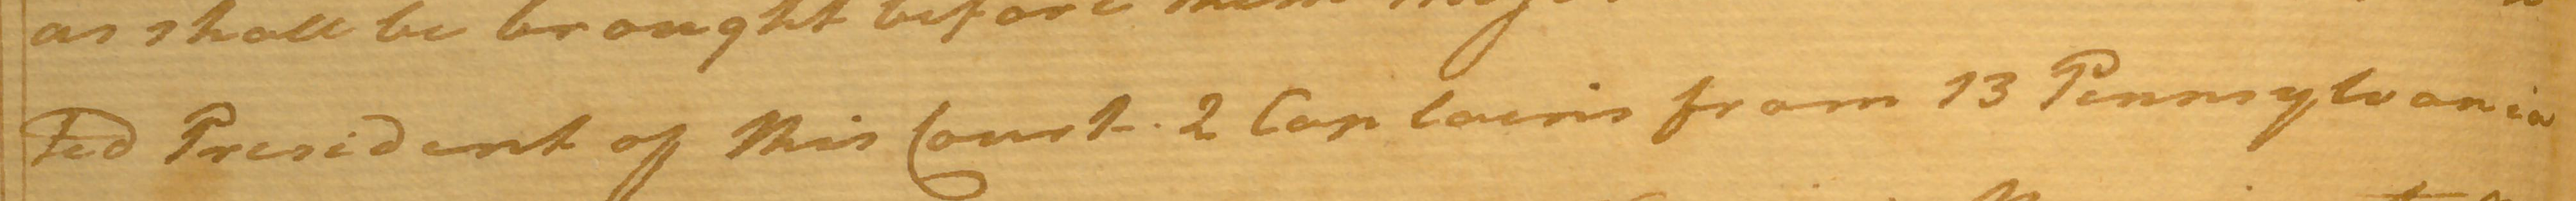ted President of this Court. 2 Captains from 13 Pennsylvania
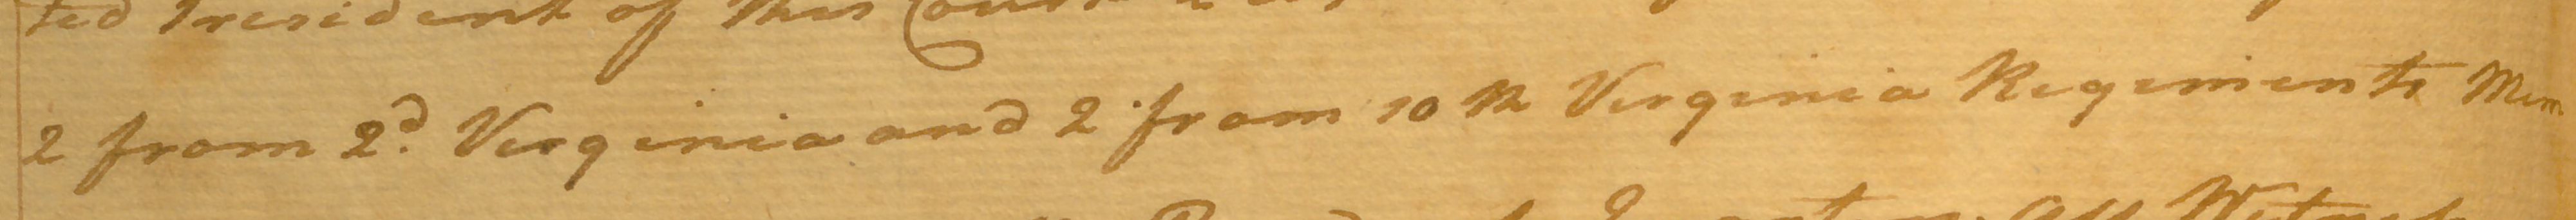2 from 2^d. Virginia and 2 from 10^th Virginia Regiments Mem
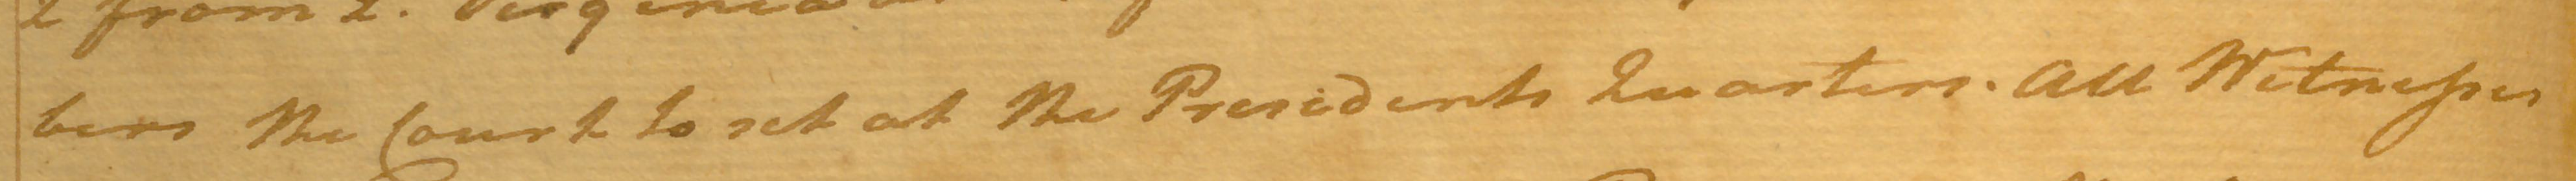bers the Court to set at the Presidents Quarters. All Witnesses
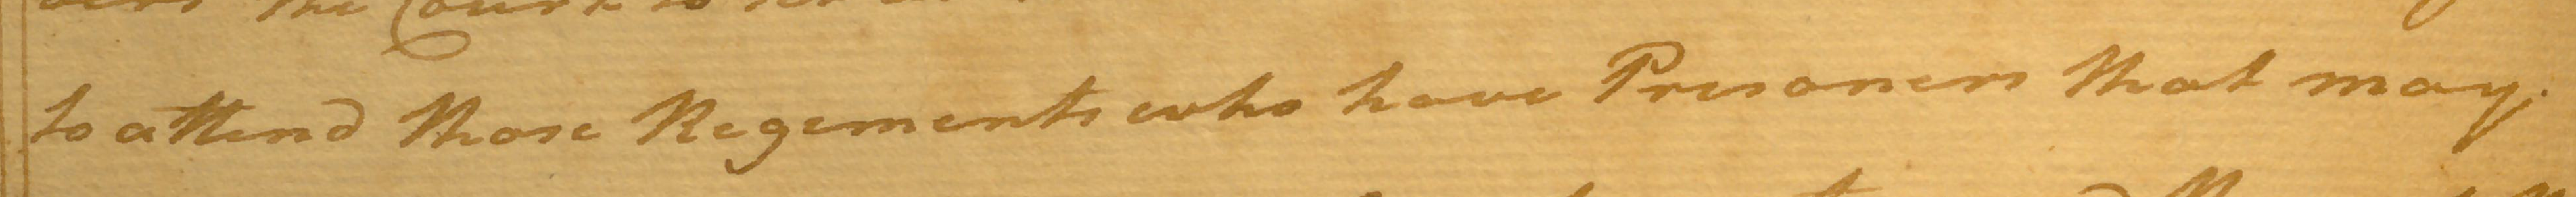to attend those Regiments who have Prisoners that may
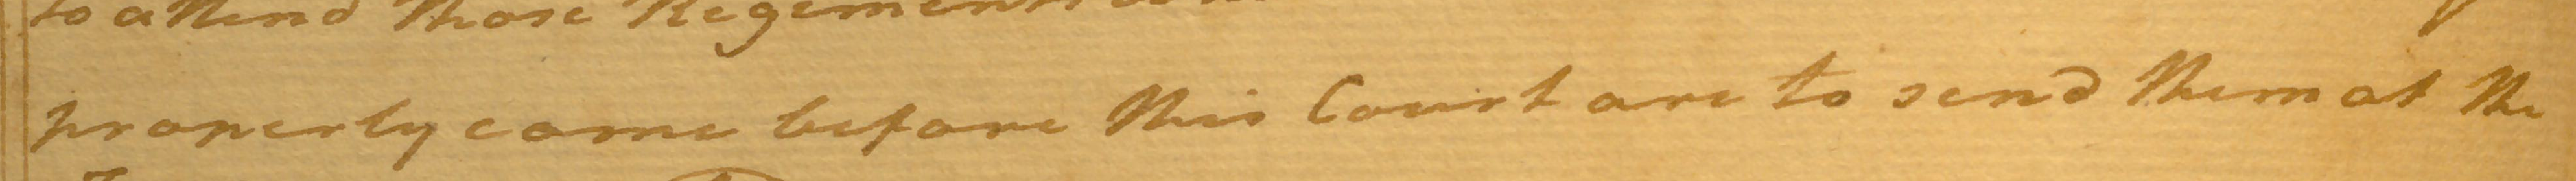properly come before this Court are to send them at the
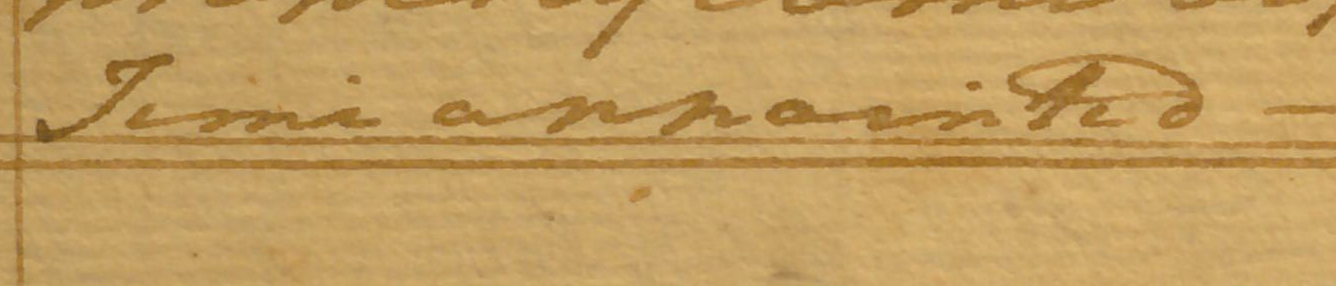Time appointed-
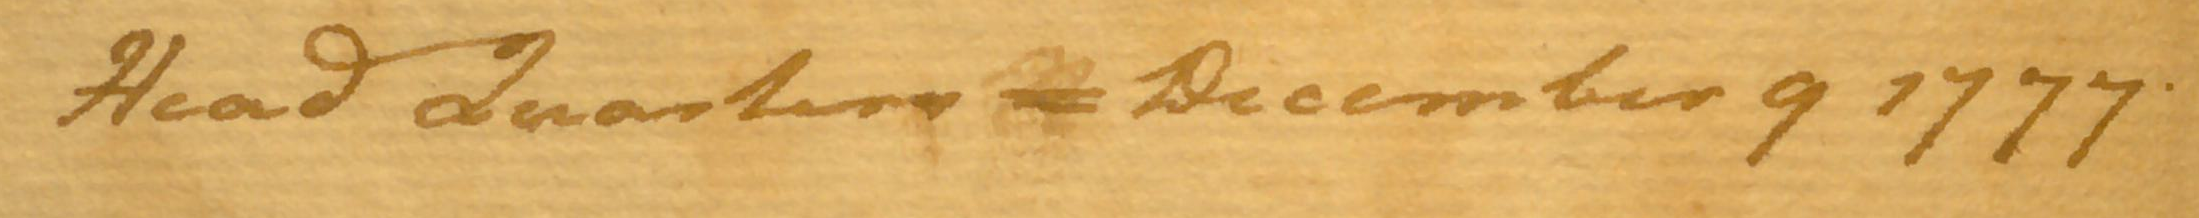Head Quarters - December 9 1777
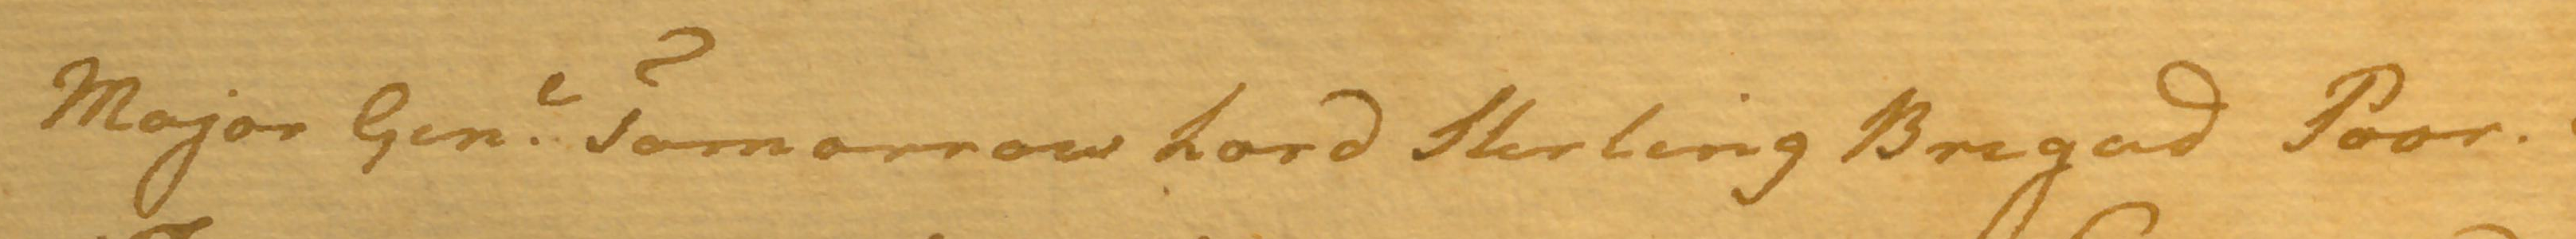Major Gen^l. Tomorrow Lord Sterling Brigad Poor
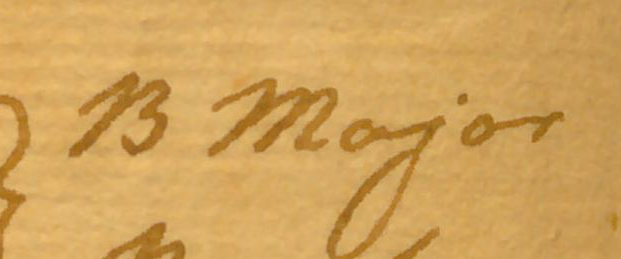B Major
